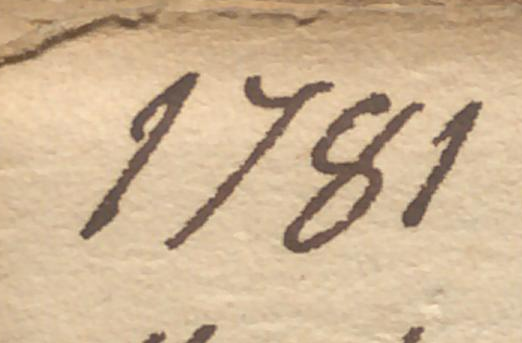1781
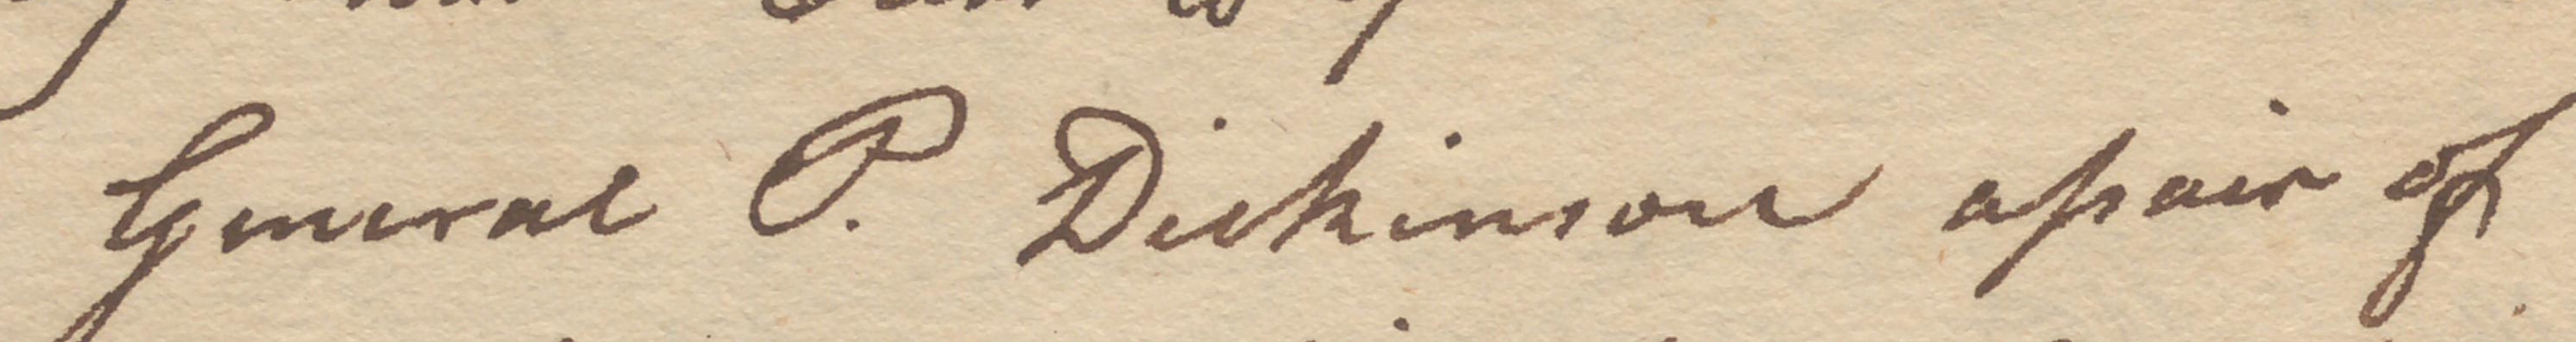General P. Dickinson a pair of
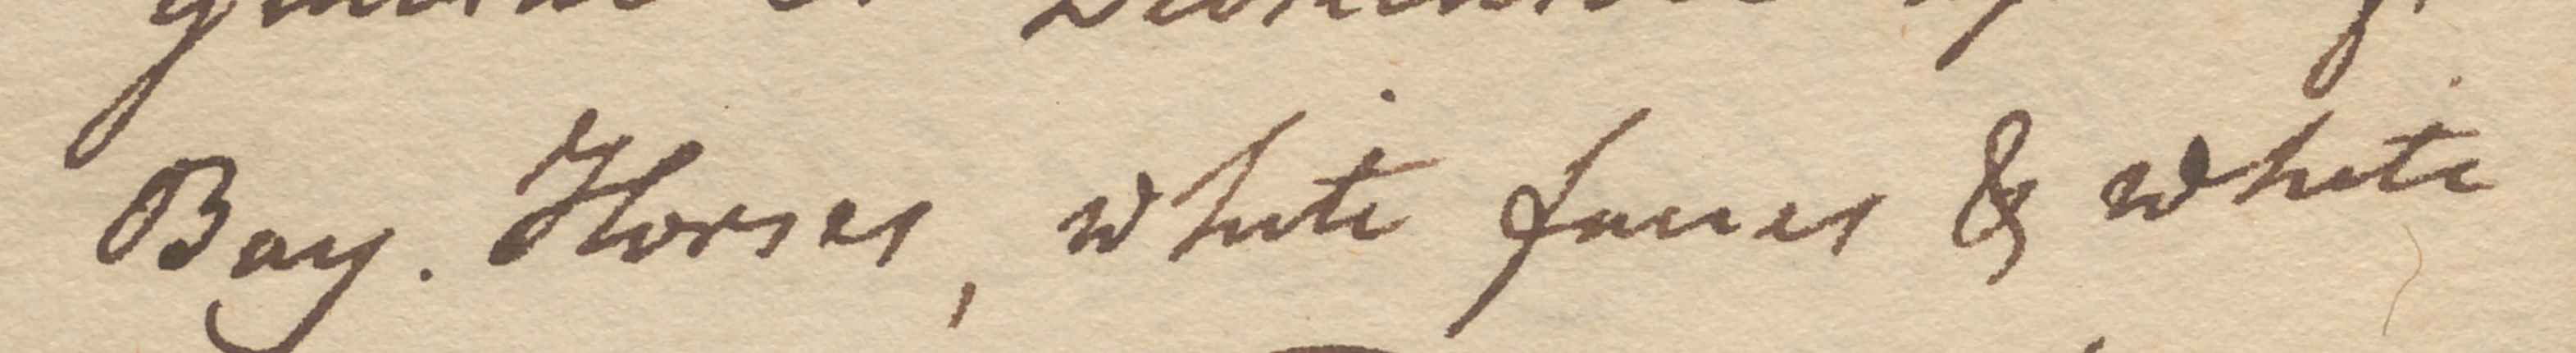Bay. Horses white fanes & white
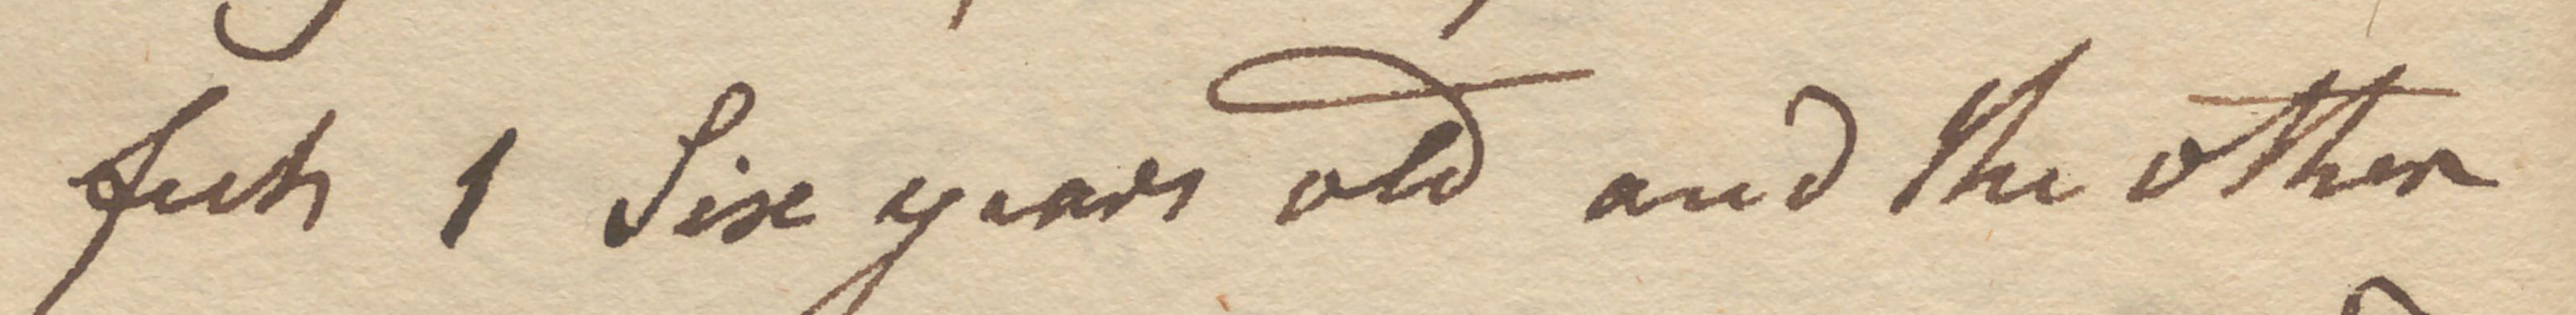feet 1 Six years old and the other
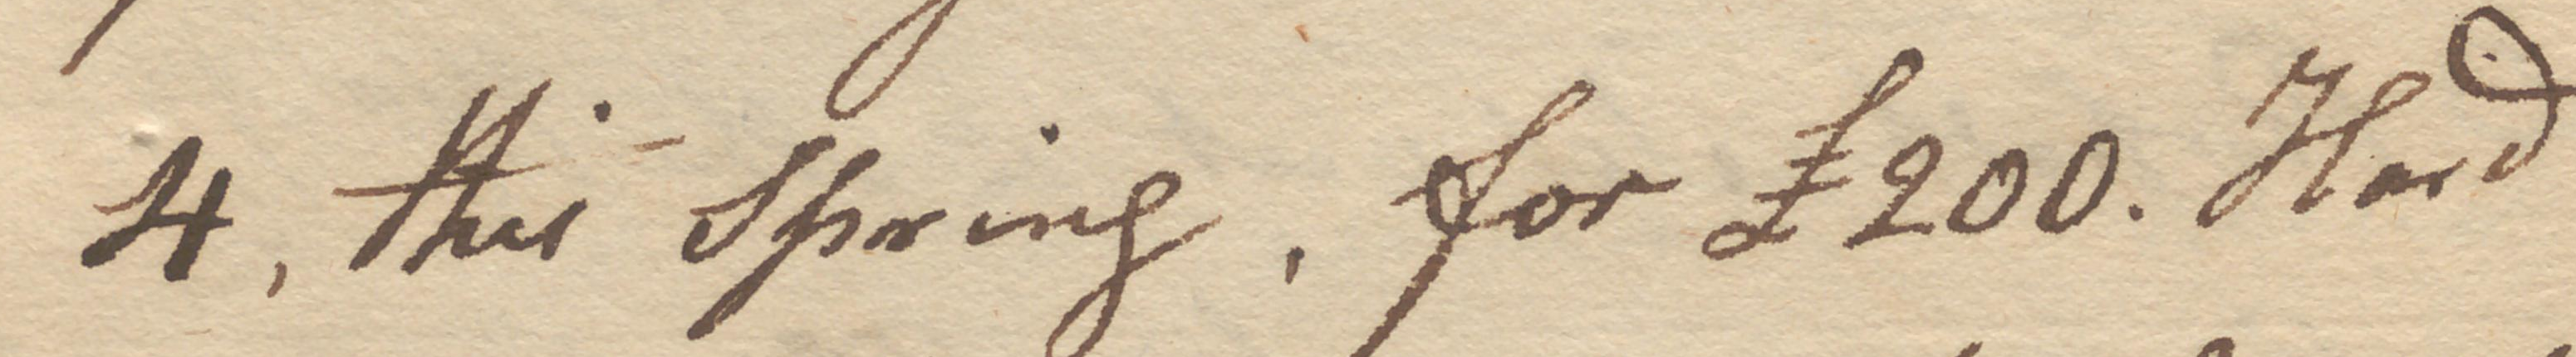4. this Spring. for £200. Hard
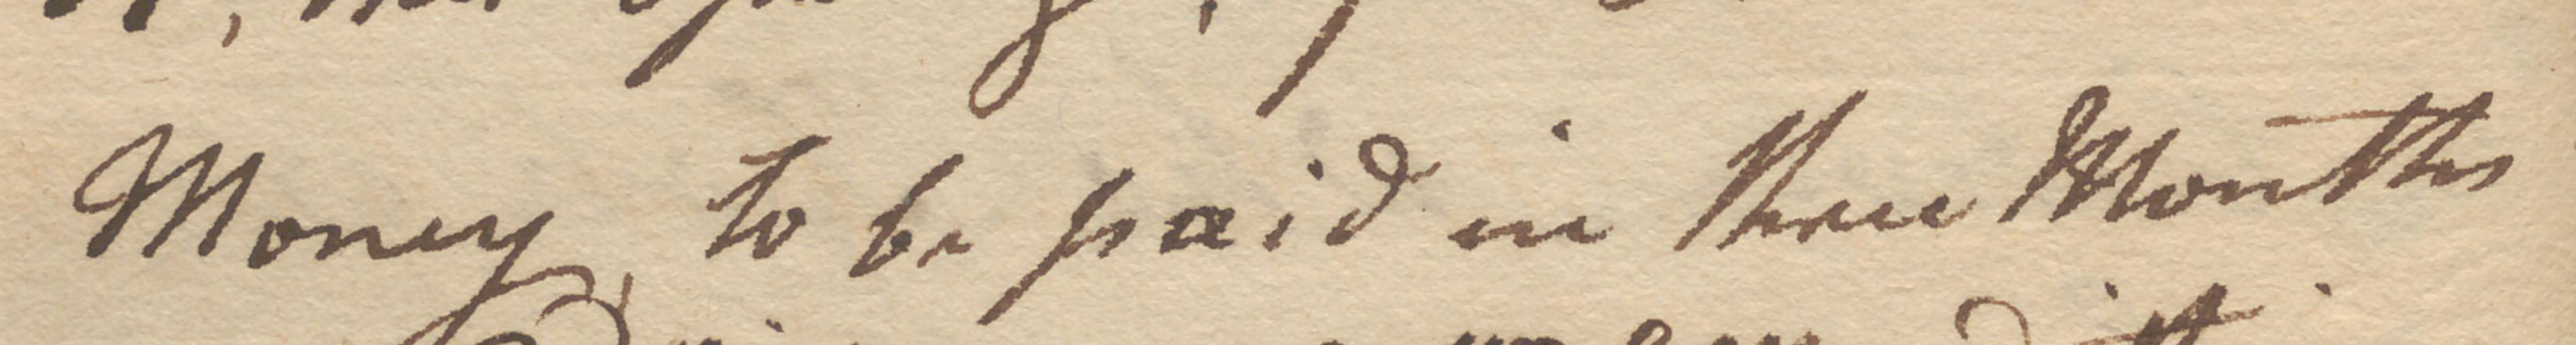Money to be paid in three Months
